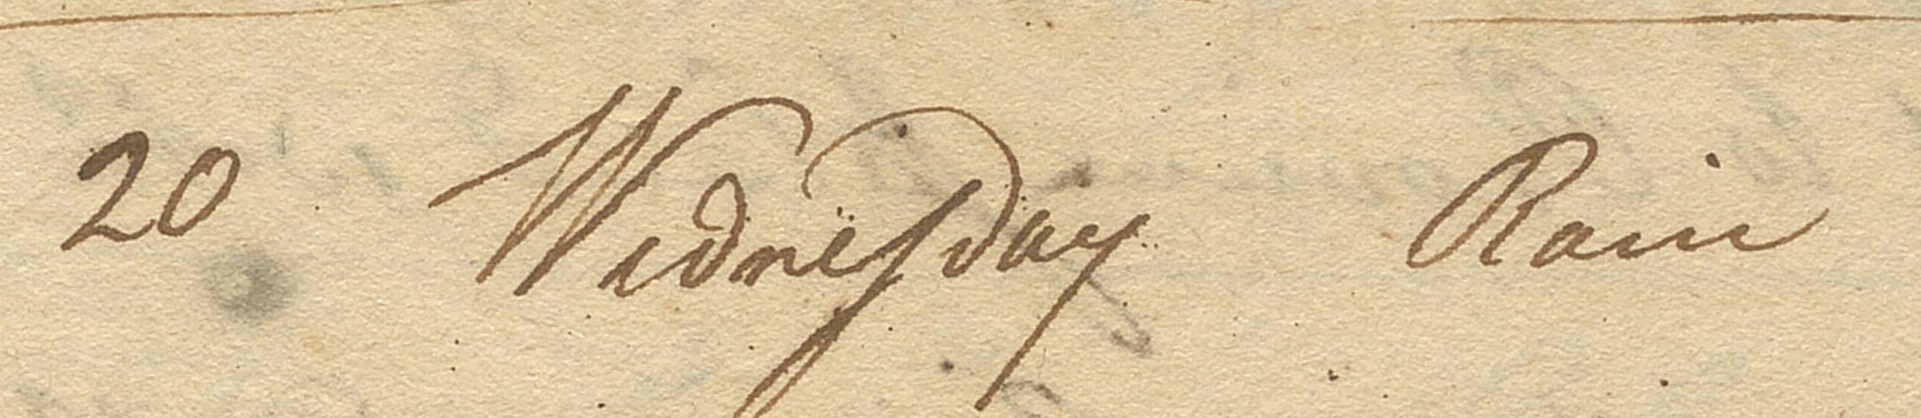20 Wednesday Rain
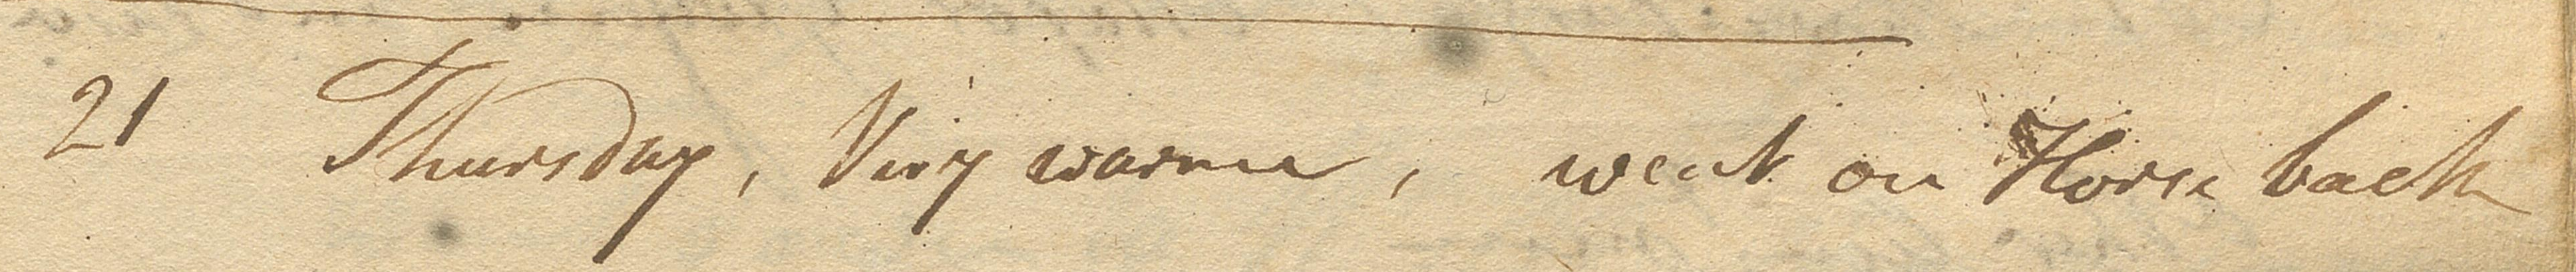21 Thursday, Very warme, went on Horse back
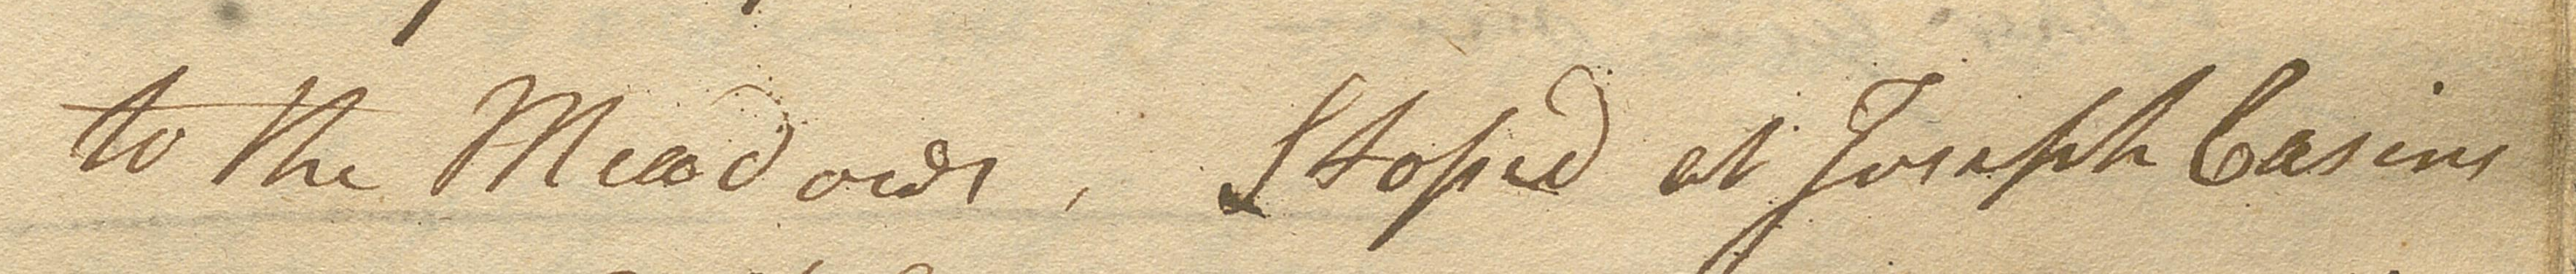to the Meadows, Stoped at Joseph Casins
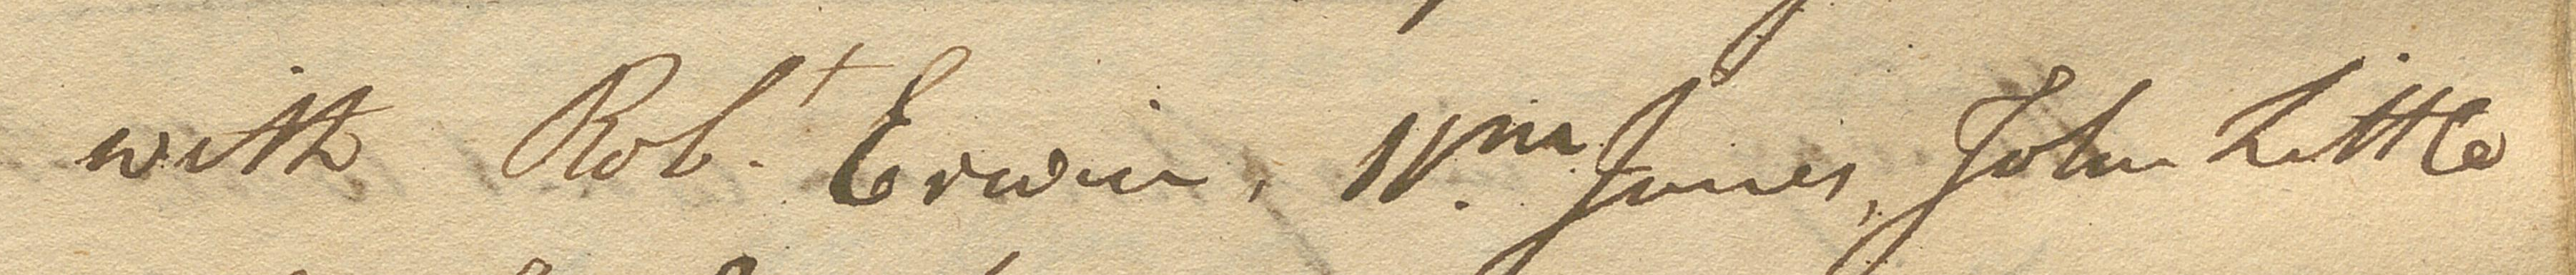with Rob^t. Erwin, W^m. Jones John Little
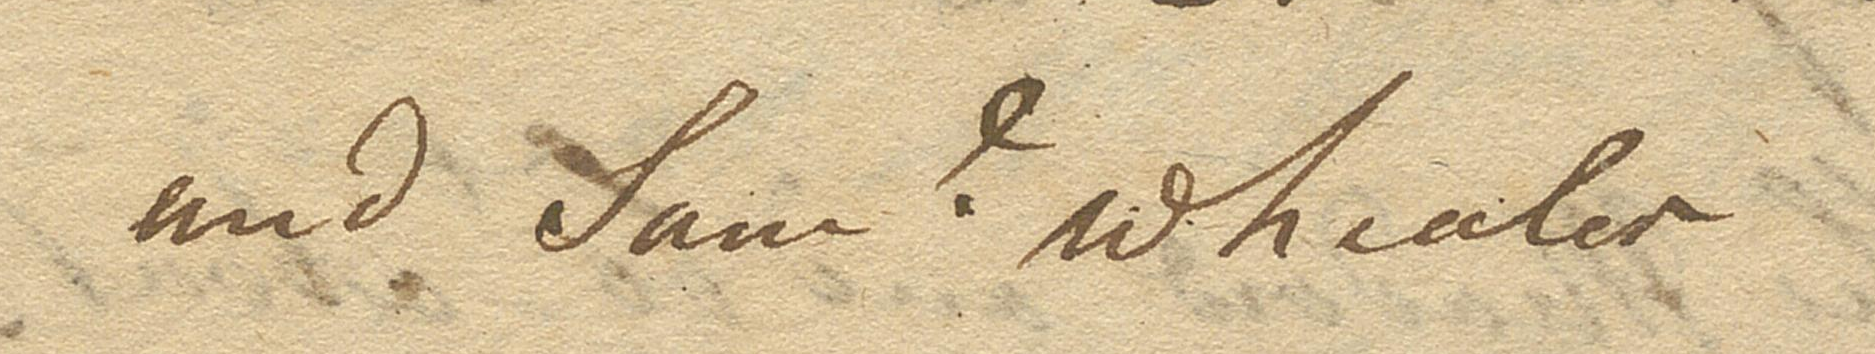and Sam^l. whealer
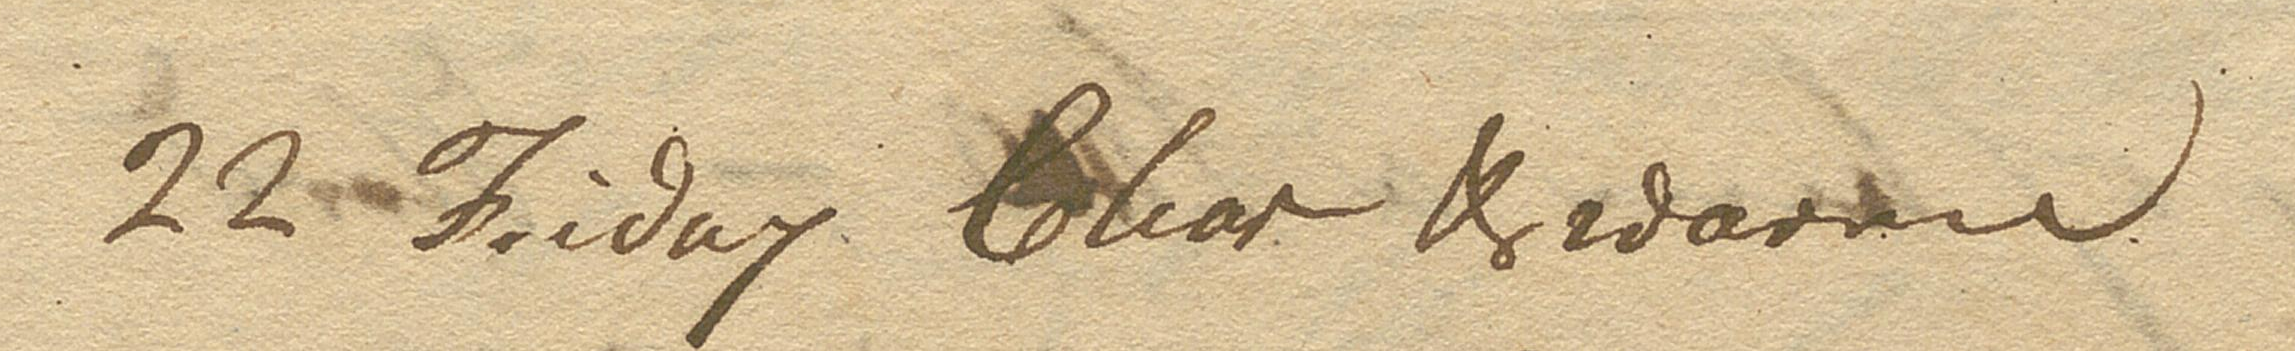22 Friday Clear & warme
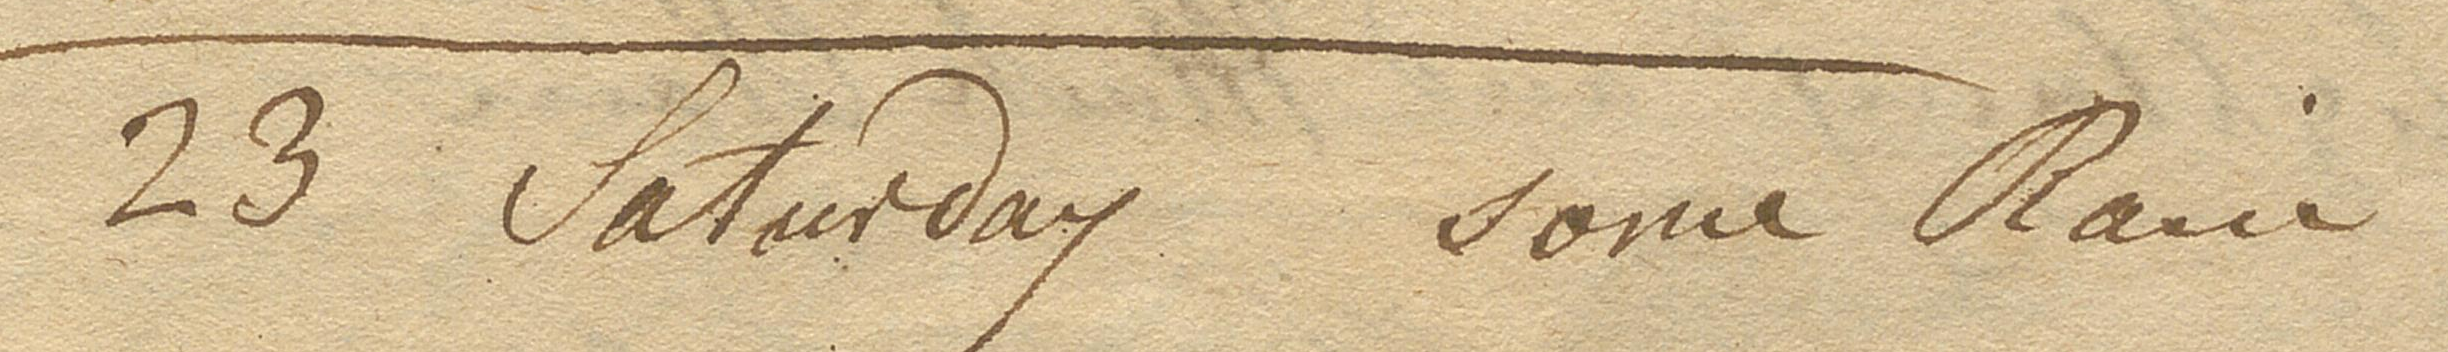23 Saturday some Rain
